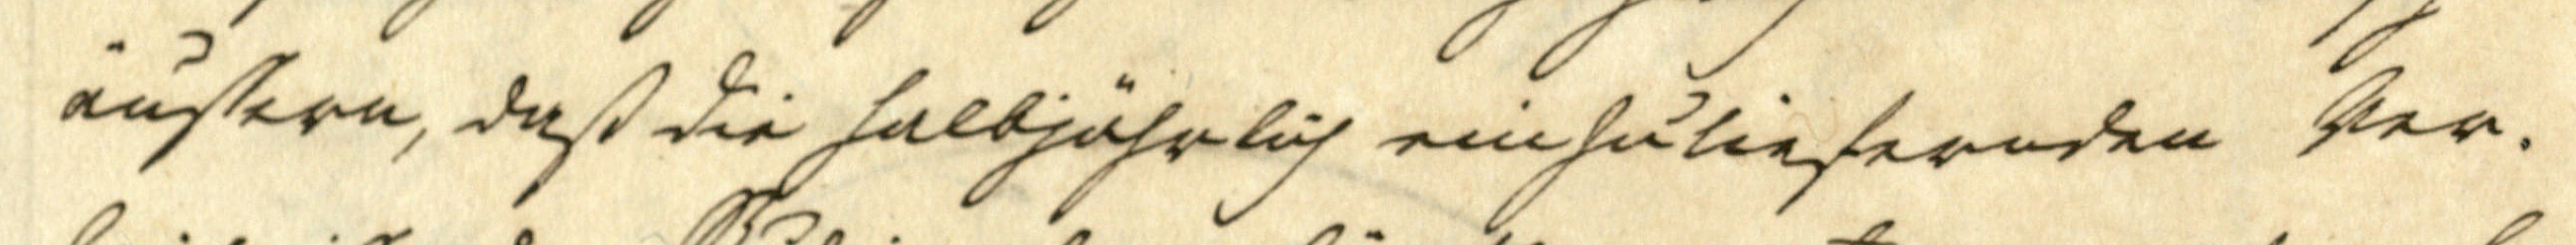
äussern, daß die halbjährlich einzuliefernden Ver¬
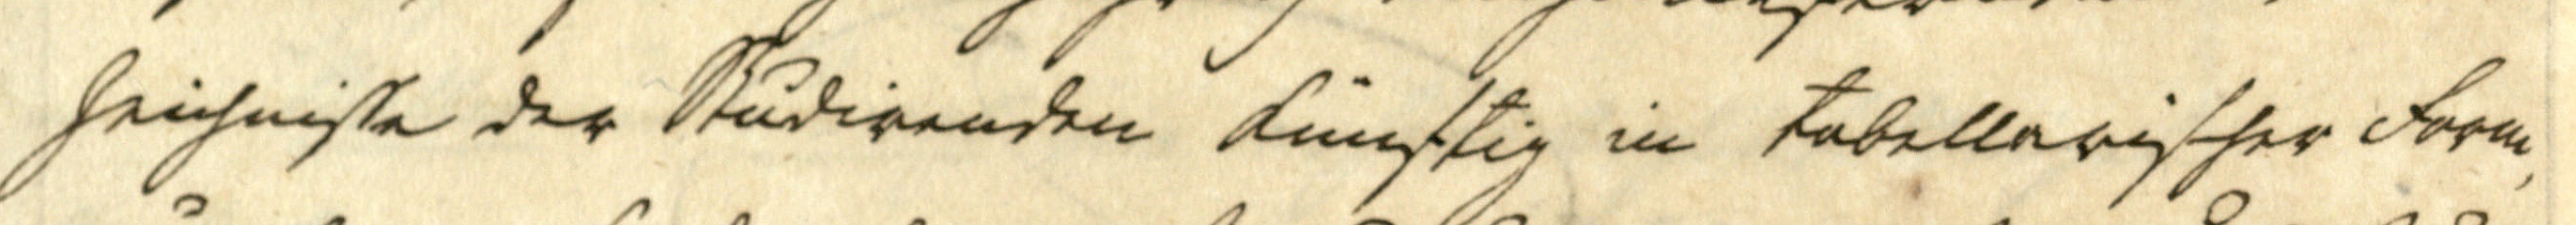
Zeichnisse der Studirenden künftig in tabellerischer Form,
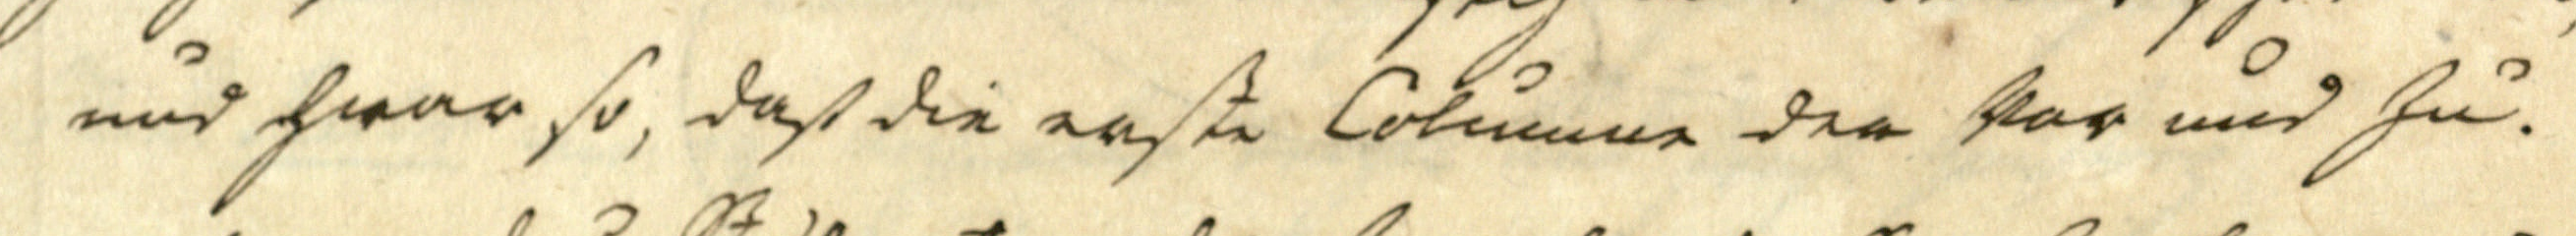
und zwar so, daß die erste Columne den Vor und Zu¬
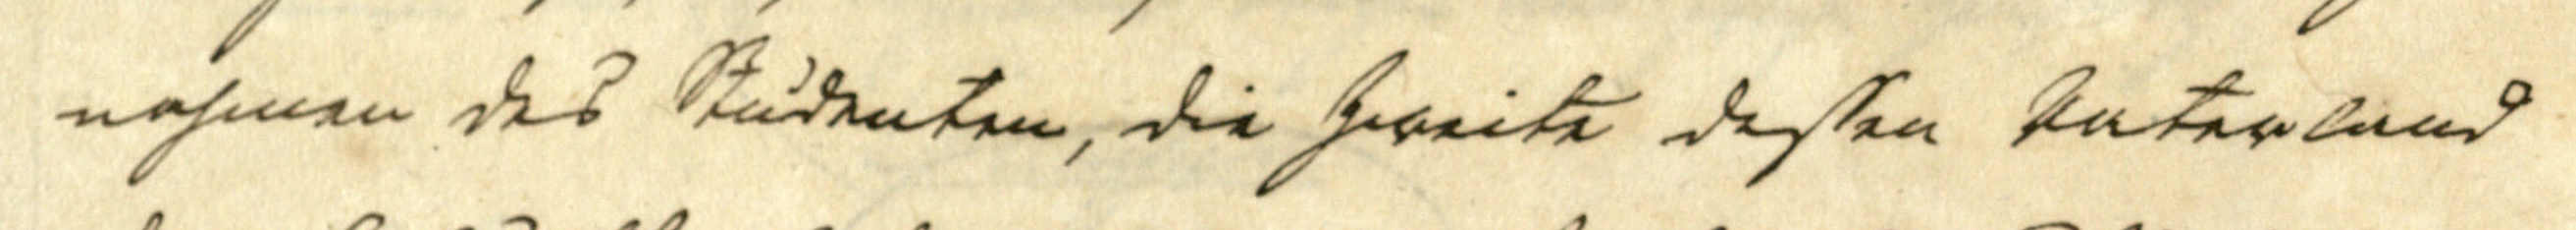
nahmen des Studenten, die zweite dessen Vaterland
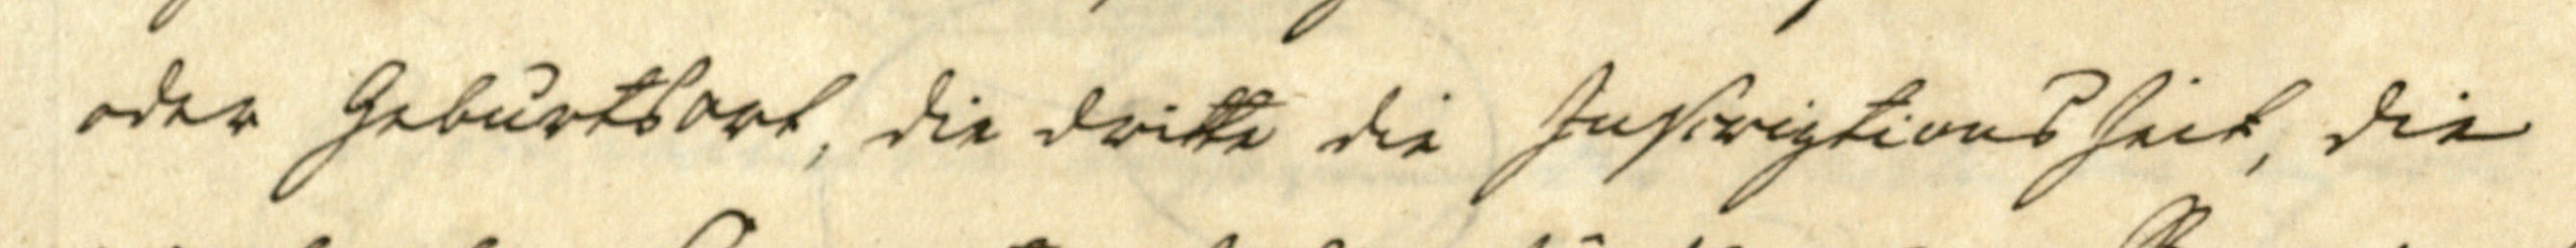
der Geburtsort, die dritte die Inscriptionszeit, die
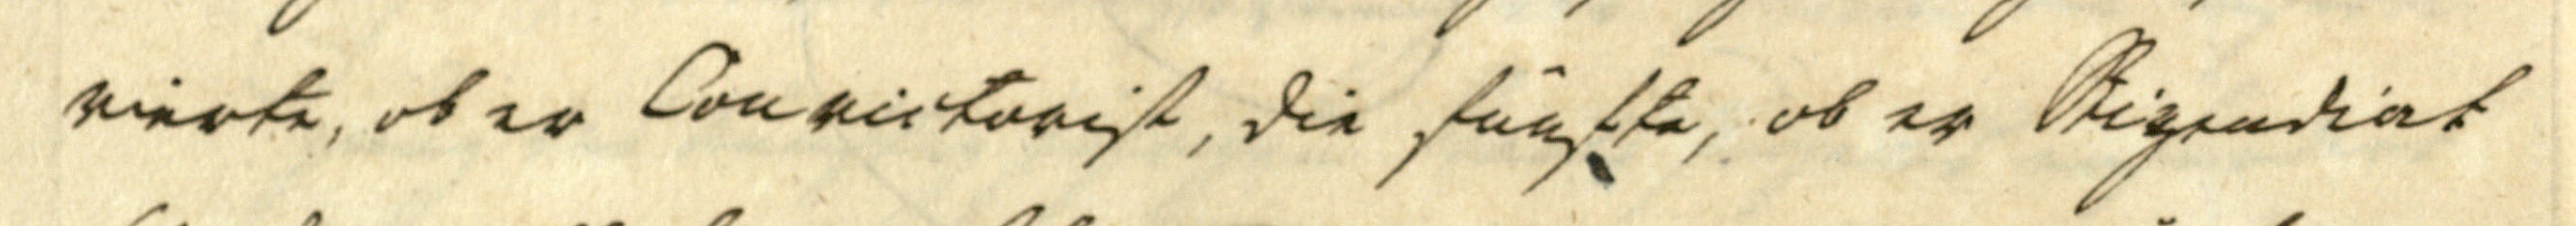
vierte, ob er Convictorist, die fünfte, ob er Stipendiat
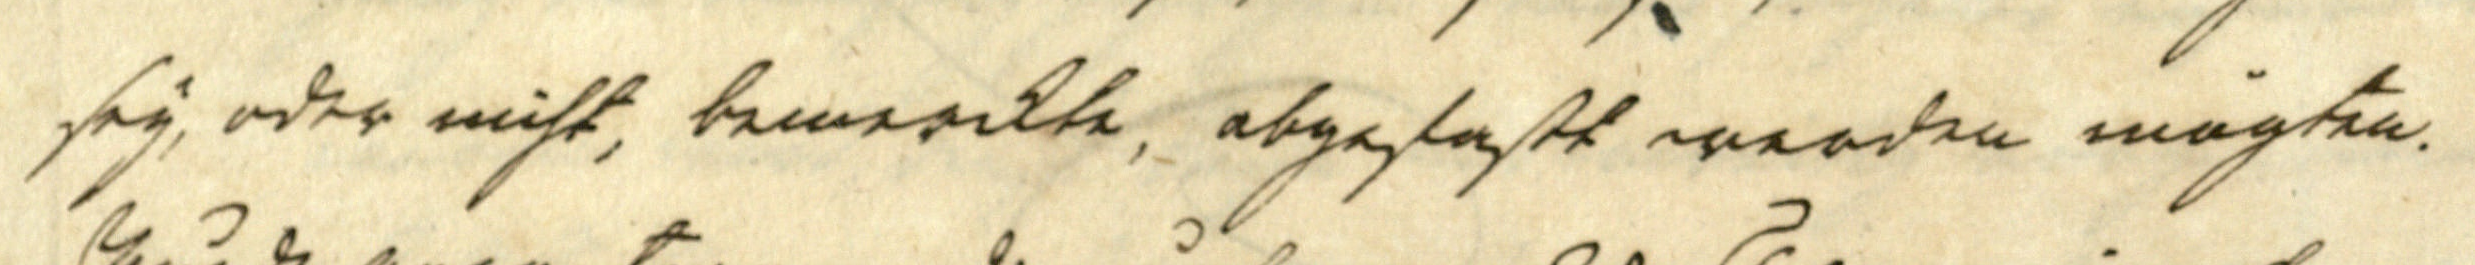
seÿ, oder nicht, bemerckte, abgefaßt werden mögten.
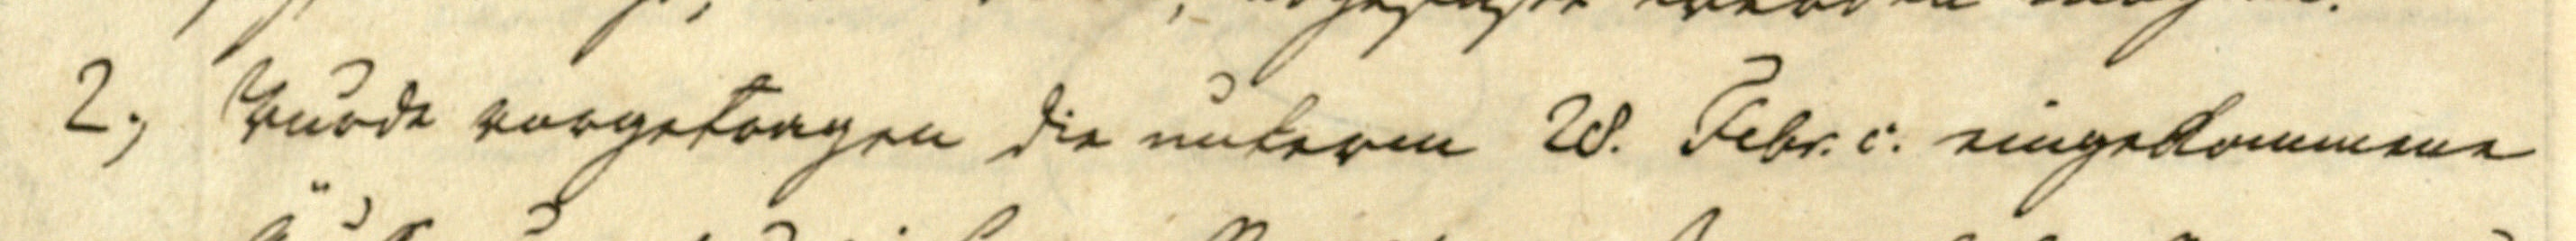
2. Wurde vorgetragen die unterm 28. Febr. c. eingekommene
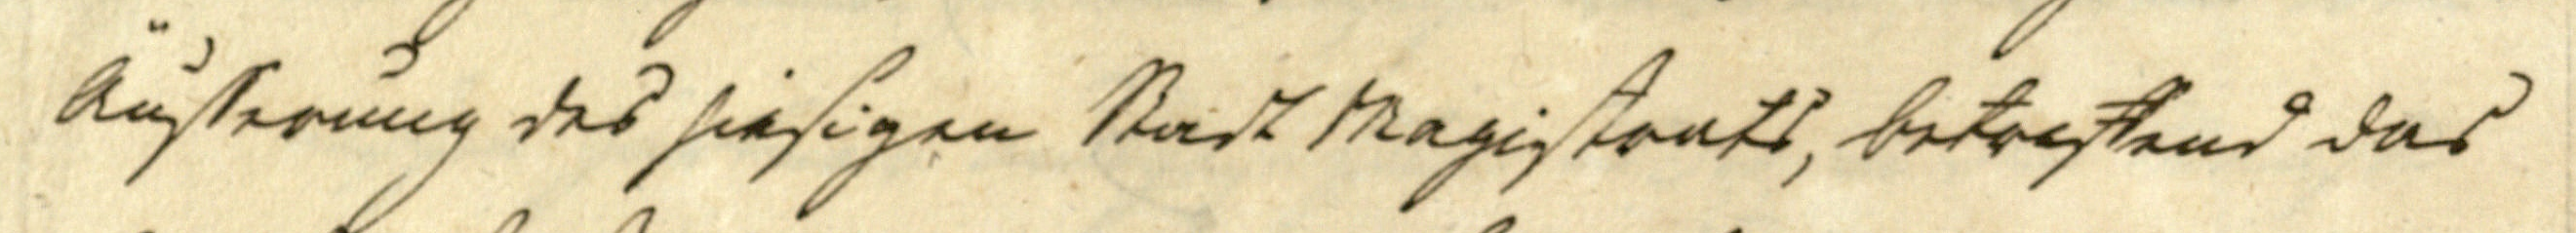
Äusserung des hiesigen Stadt Magistrats, betreffend das
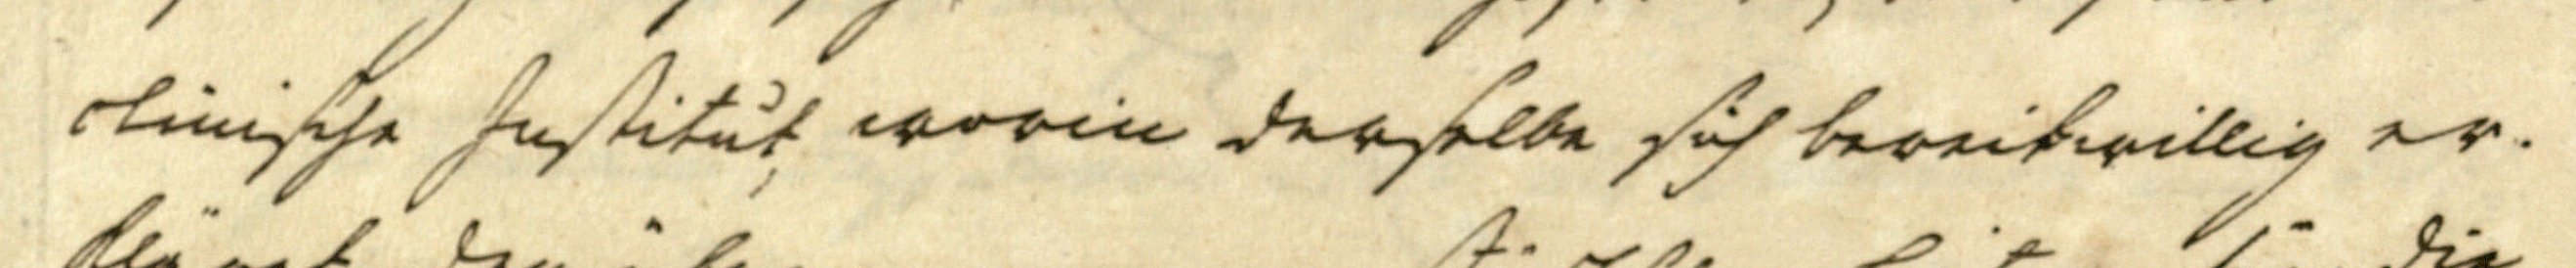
clinische Institut, worin derselbe sich bereitwillig er¬
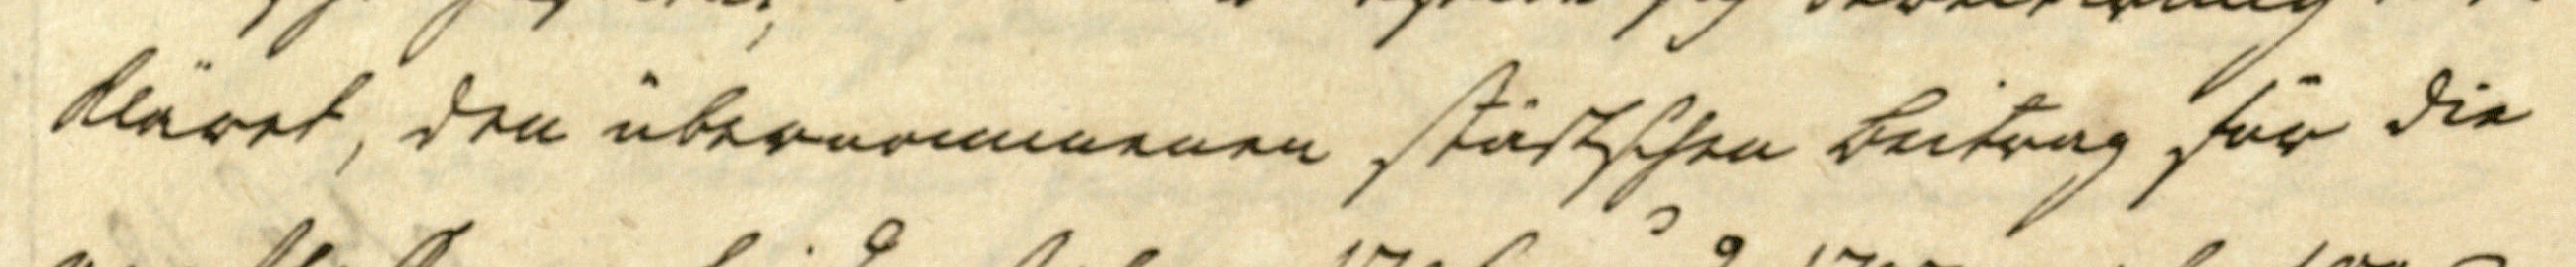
kläret, den übernommenen städtischen Beitrag für die
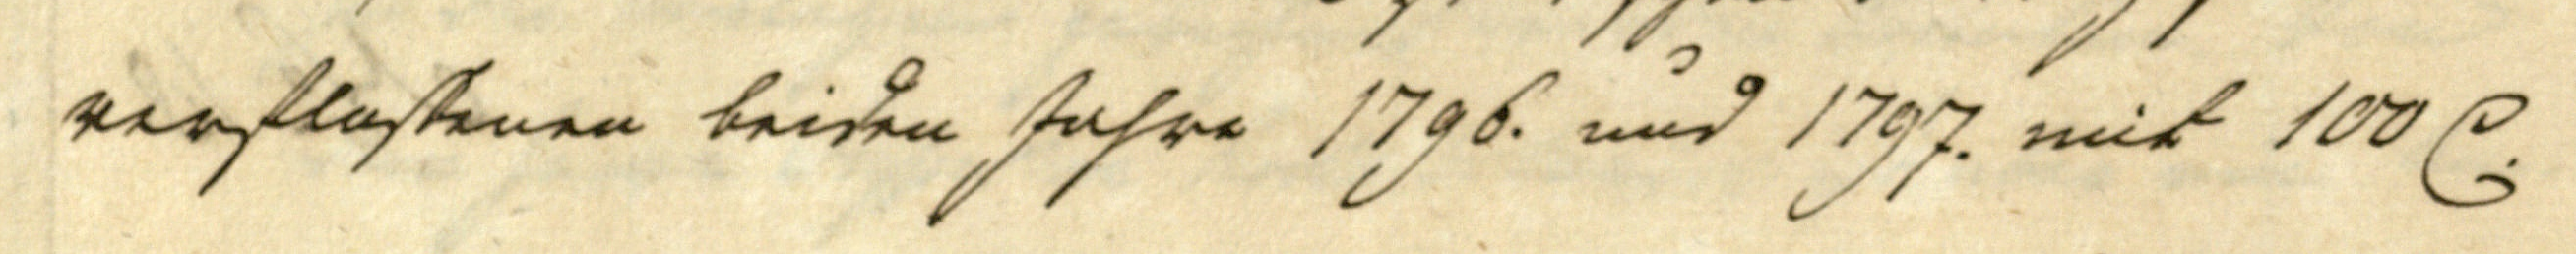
verflossenen beiden Jahre 1796. und 1797. mit 100 l.
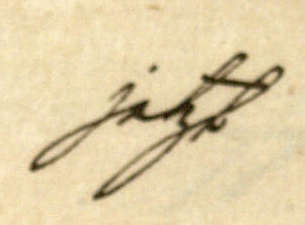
jetzt
